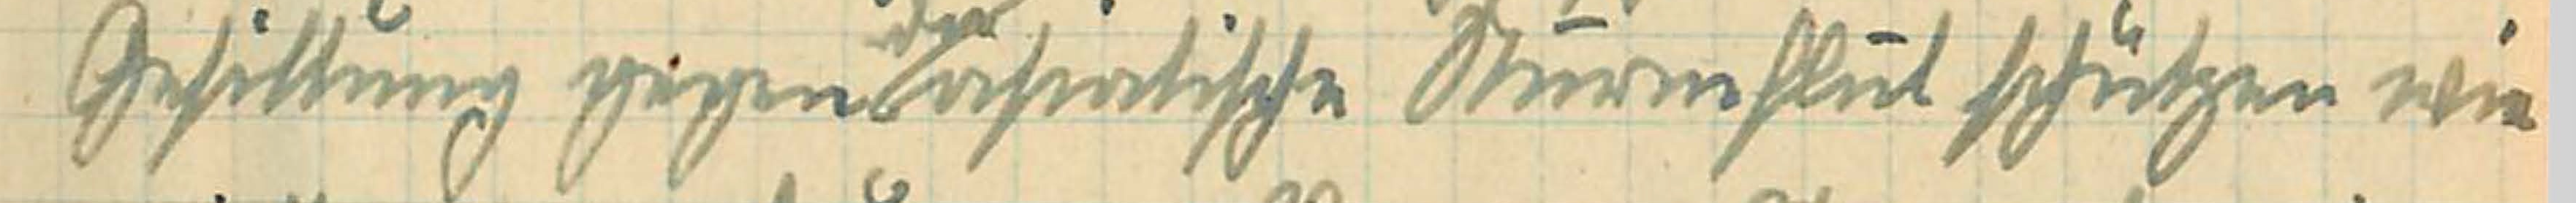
Gesittung gegen asiatische Sturmflut schützen wie
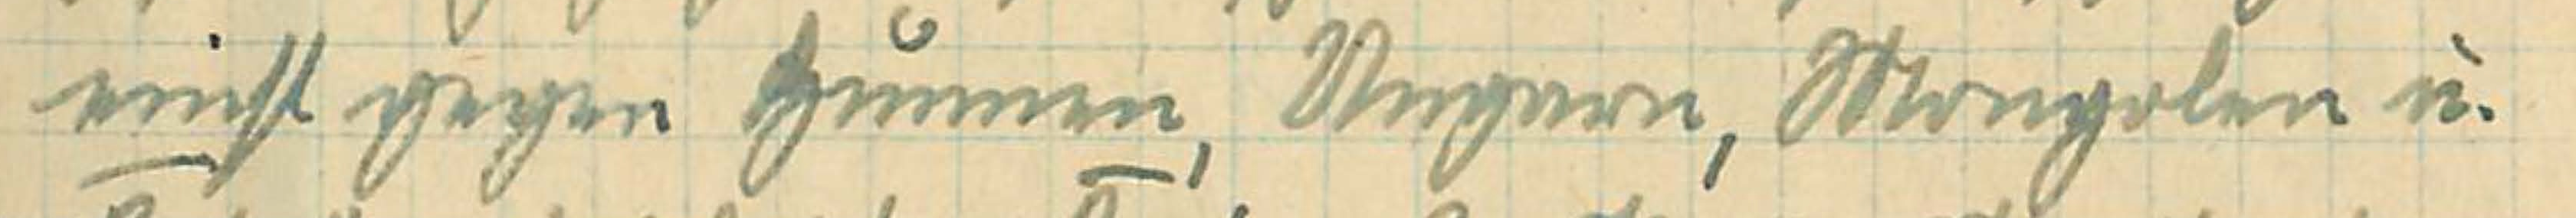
einst gegen Hunnen, Ungarn, Mongolen u.
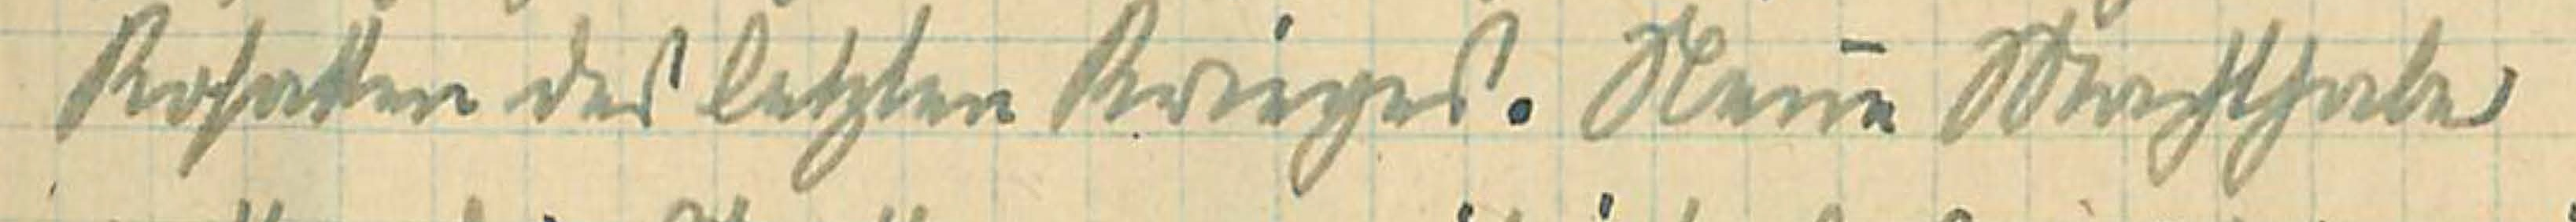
Kosaken des letzten Krieges. Neue Machthaber
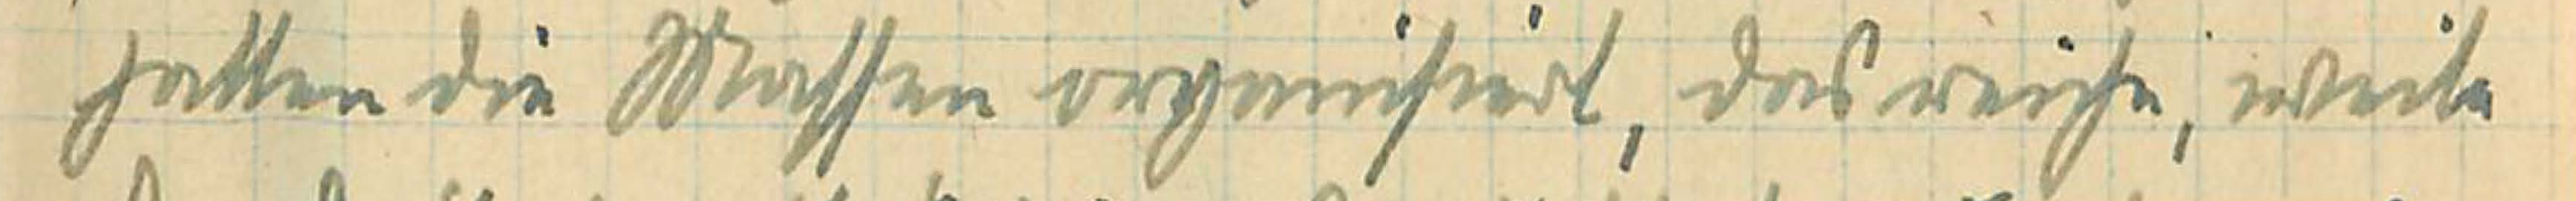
hatten die Massen organisiert, das reiche, weite
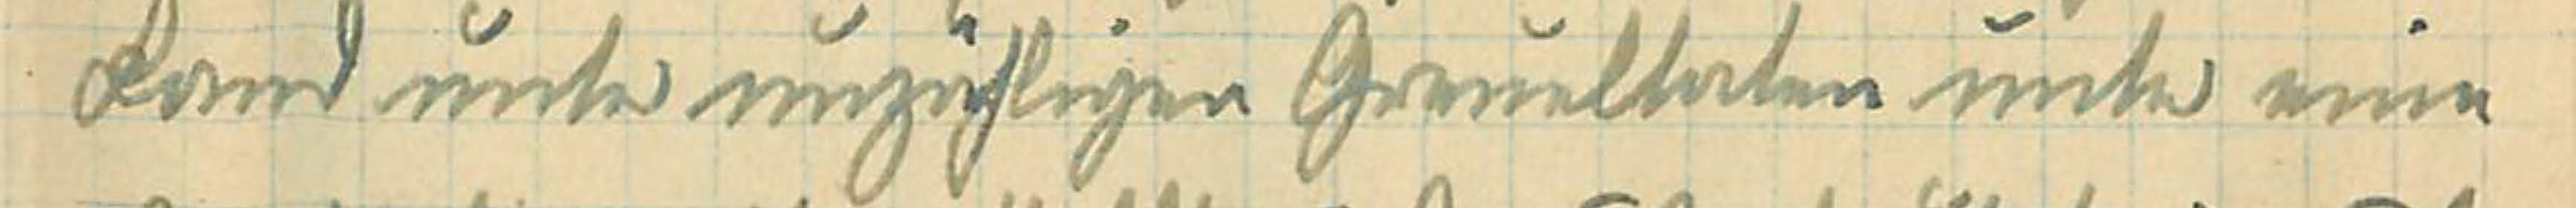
Land unter unzähligen Greueltaten unter eine
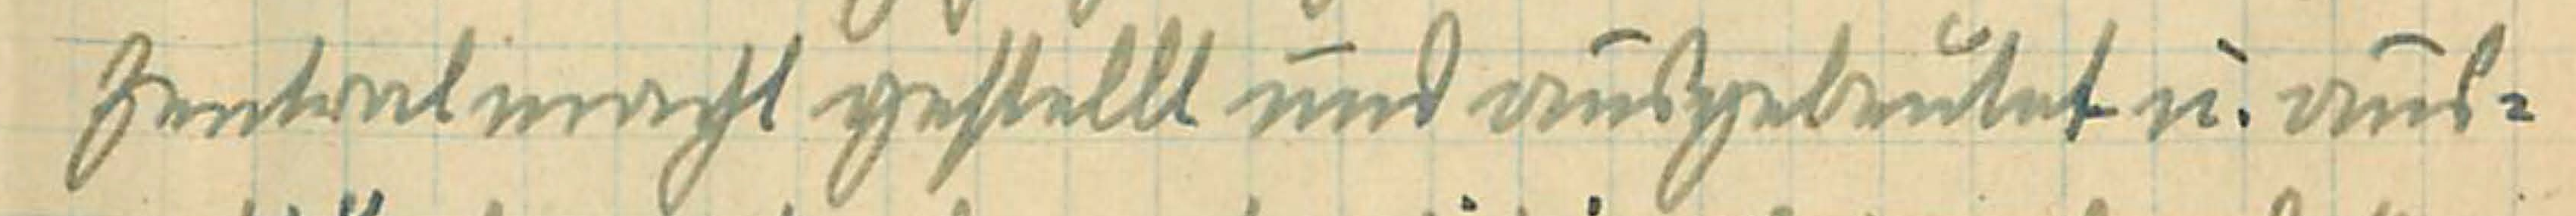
Zentralmacht gestellt und ausgebeutet u. aus-
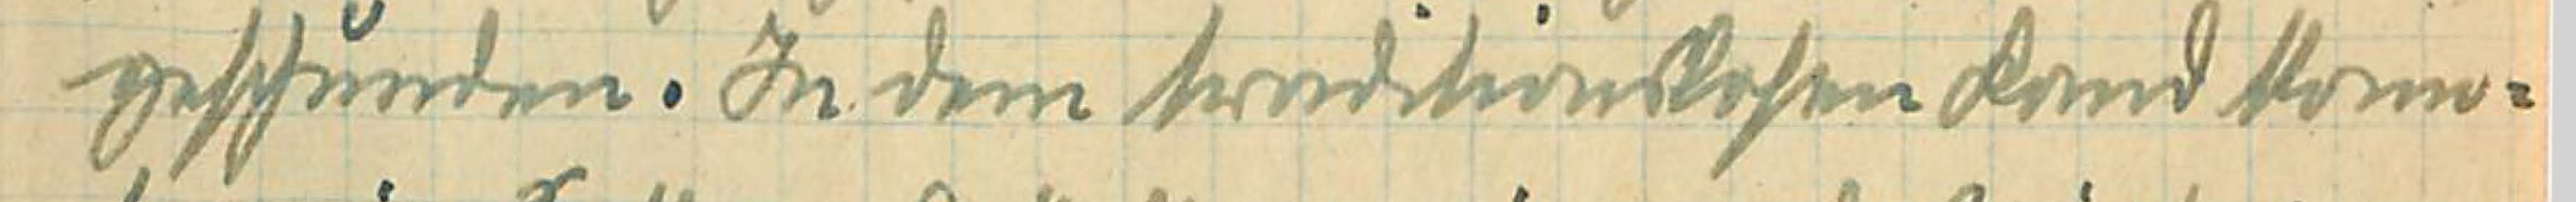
geschunden. In dem traditionslosen Land konn-
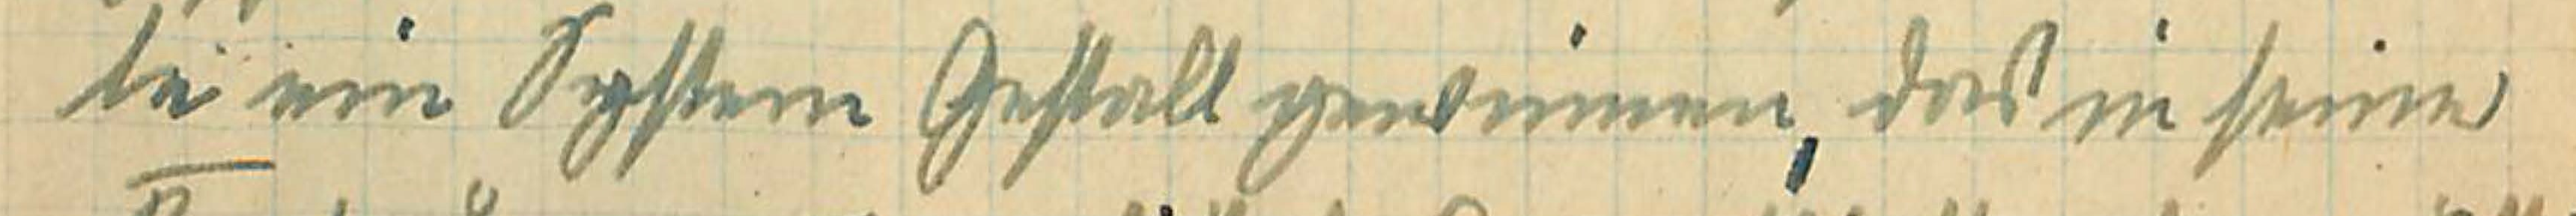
te ein System Gestalt gewinnen, das in seiner
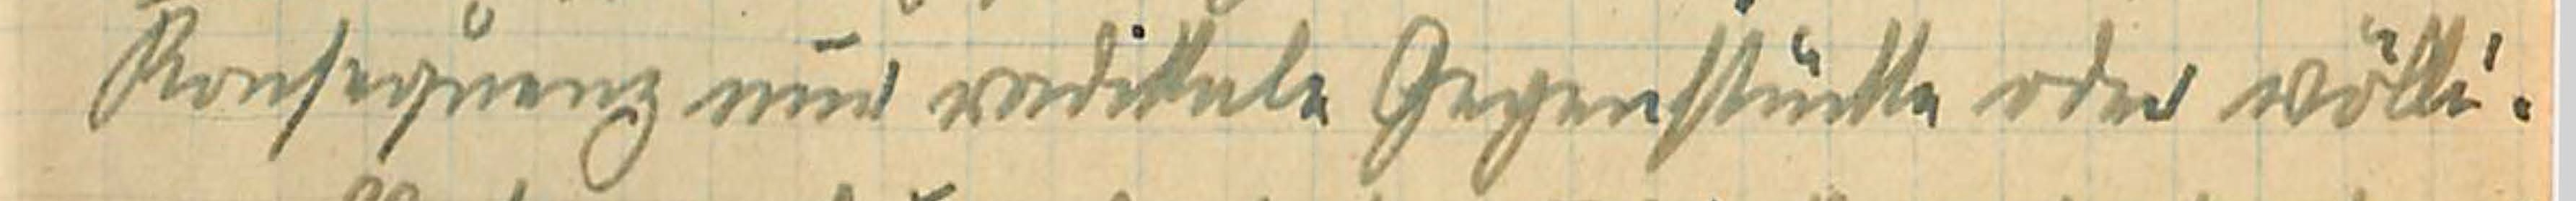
Konsequenz nur radikale Gegenstücke oder völli-
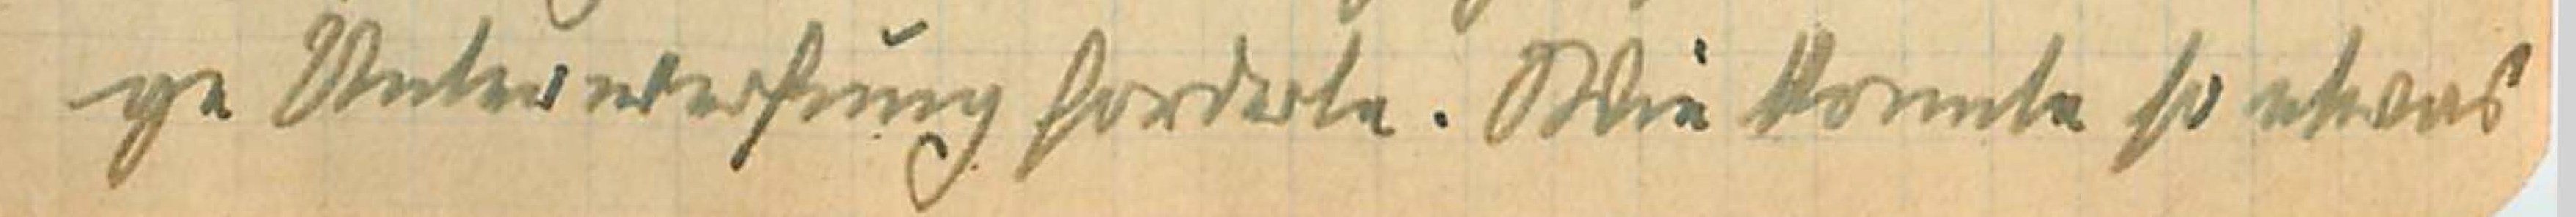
ge Unterwerfung forderte. Wie konnte so etwas
